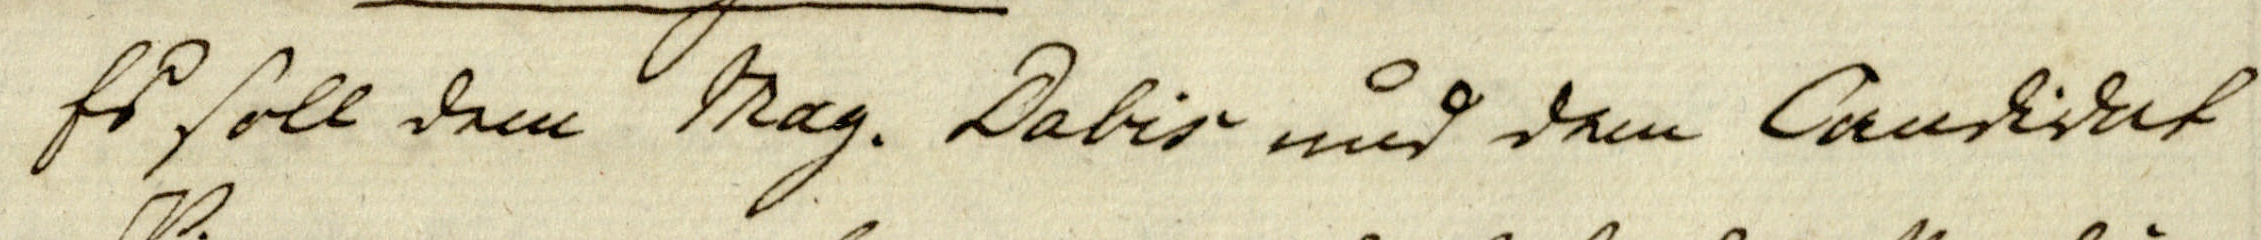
Es soll dem Mag. Dabis und dem Candidat
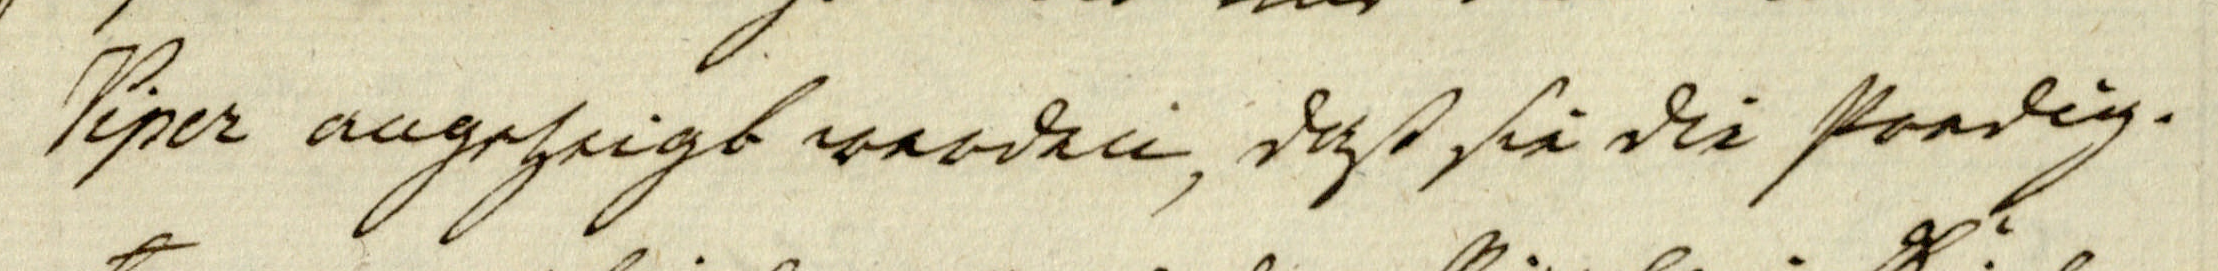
Piper angezeigt werden, daß sie die Predig¬
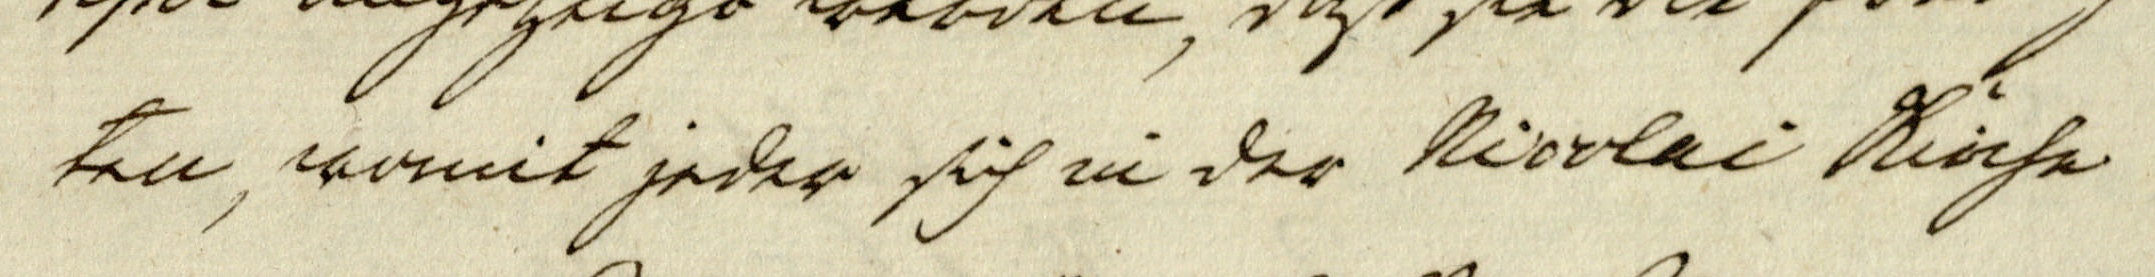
ten, womit jeder sich in der Nicolai Kirche
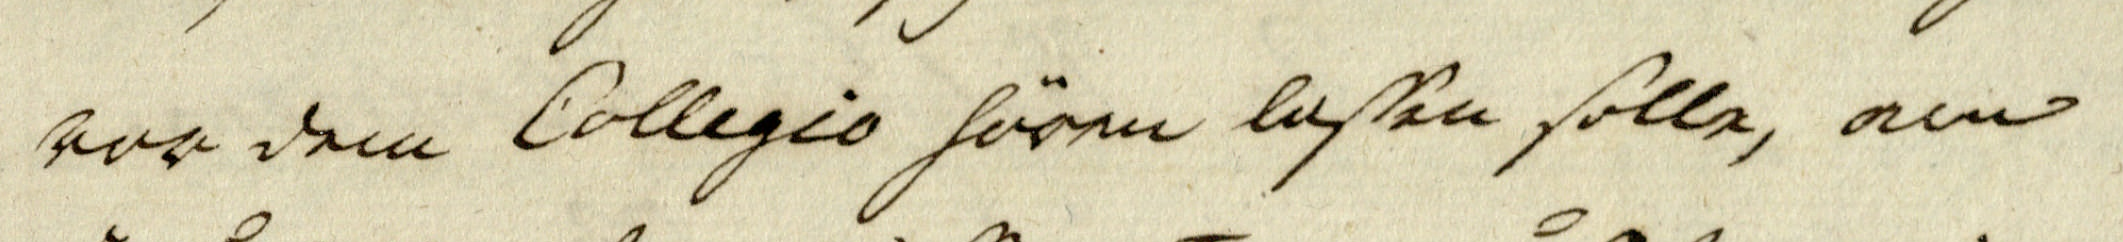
vor dem Collegio hören lassen solle, am
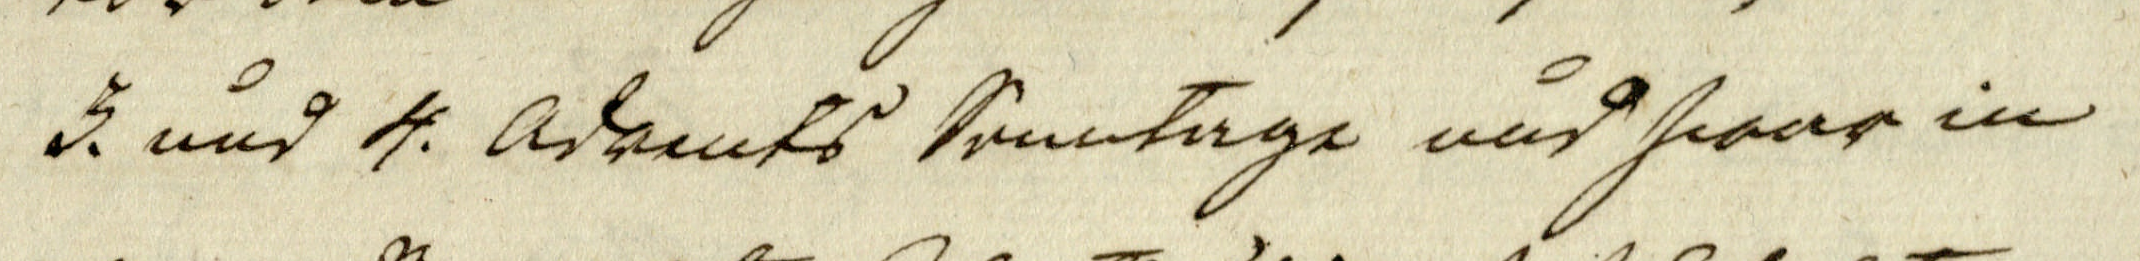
3. und 4. Advents Sonntage und zwar in
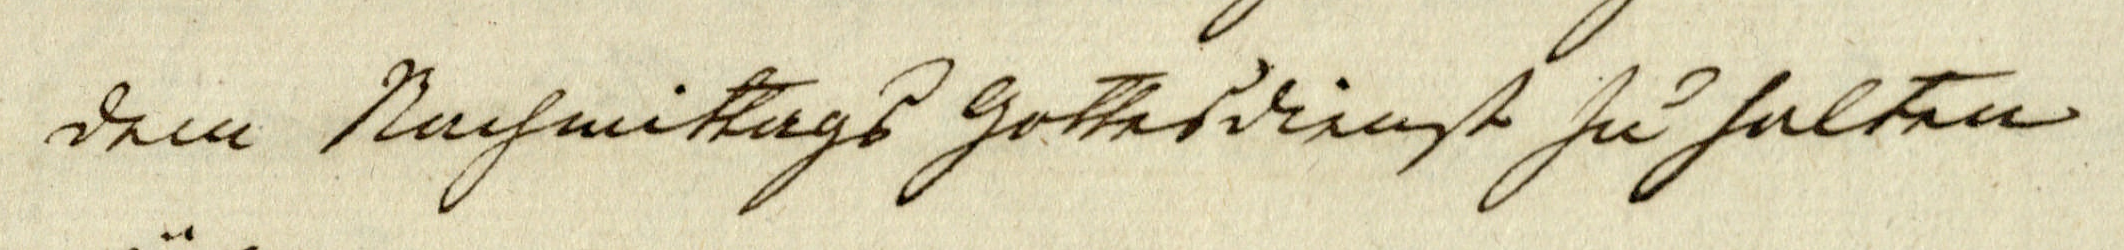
dem Nachmitags Gottesdienst zu halten
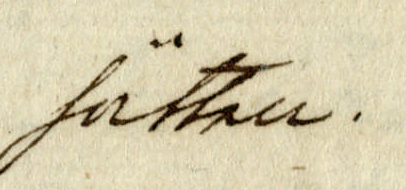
hätten.
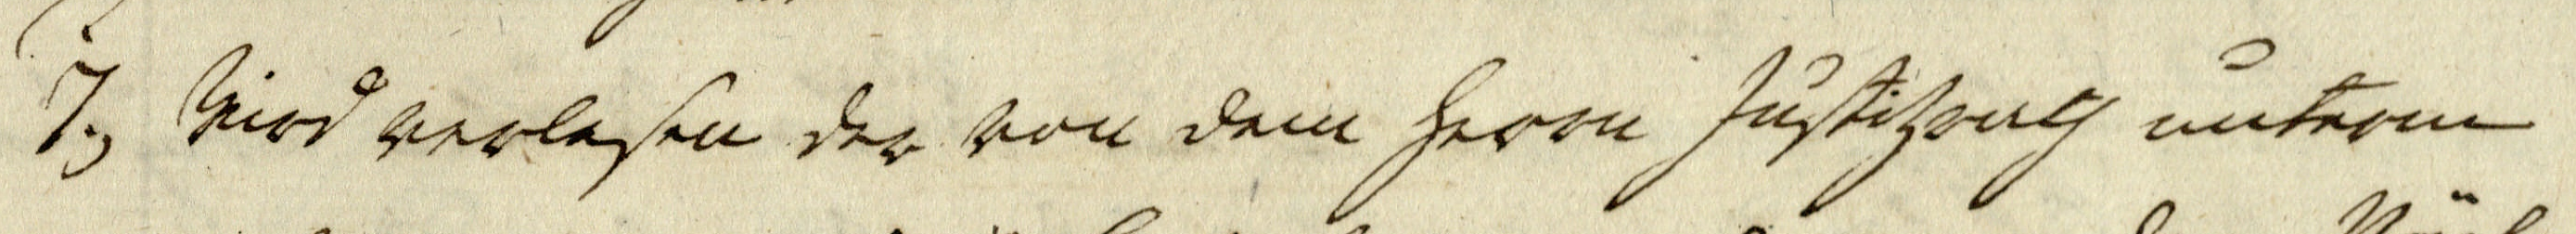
7., Wird verlesen der von dem Herrn Justizrath unterm
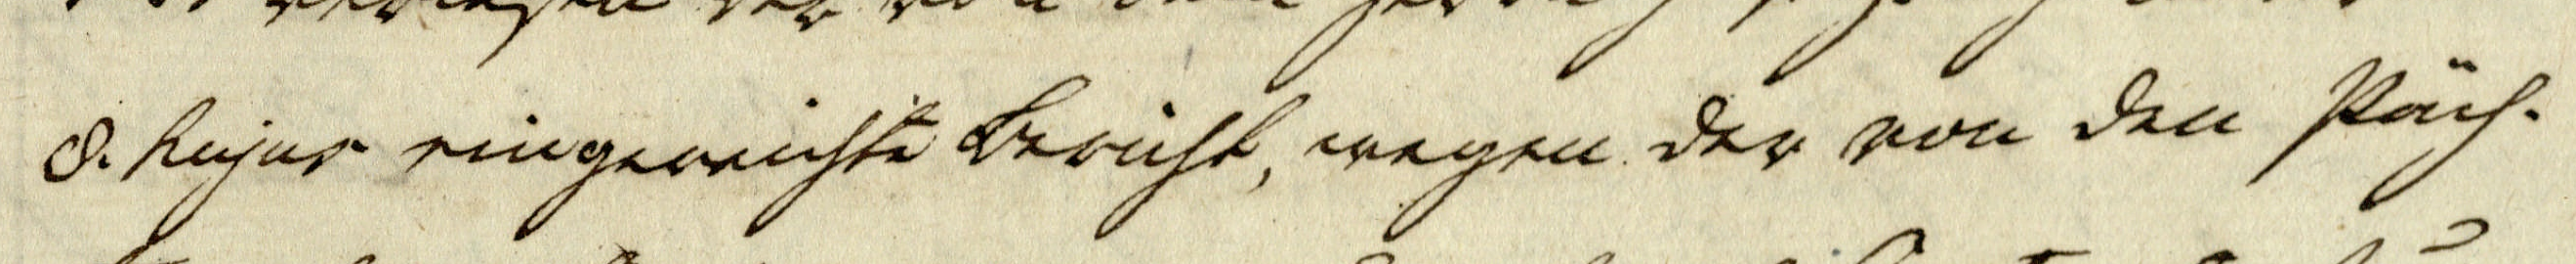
8. hujus eingereichte Bericht, wegen der von den Päch¬
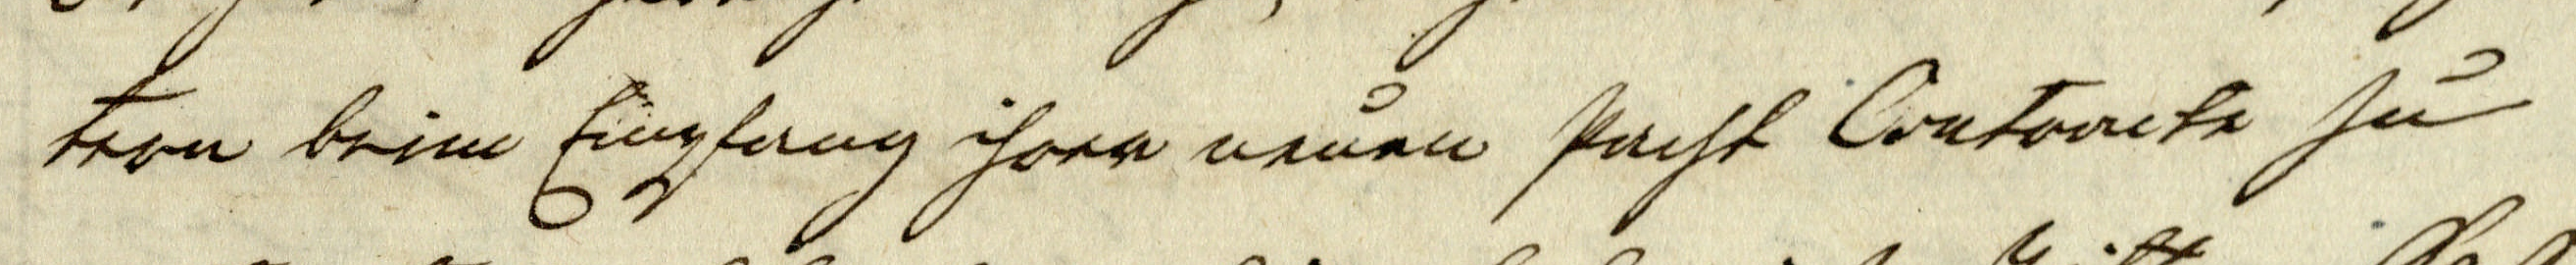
tern beim Empfang ihren neuen Pacht Contracte zu
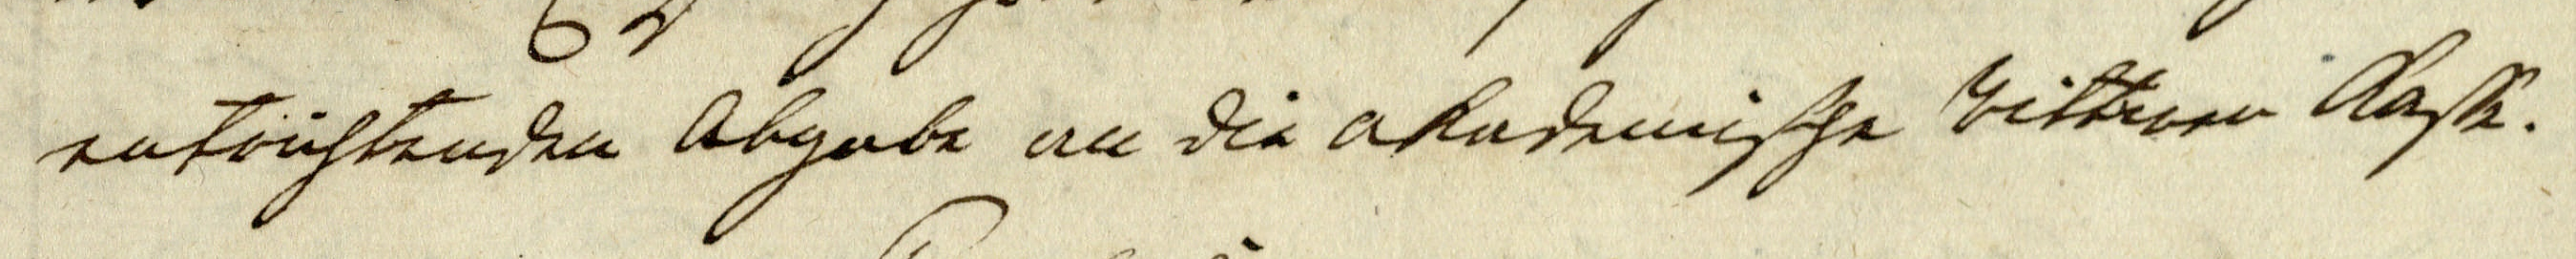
entrichtenden Abgabe an die akademische Wittwen Kasse.
